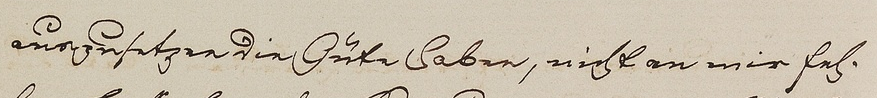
auszusetzen die Güte haben, nicht an mir feh-
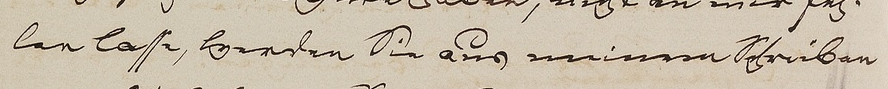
len lasse, werden Sie aus meinem Schreiben
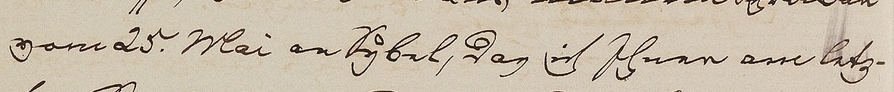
vom 25. Mai an Sybel, das ich Ihnen am letz-
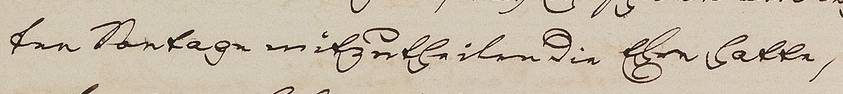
ten Sontage mitzutheilen die Ehre hatte,
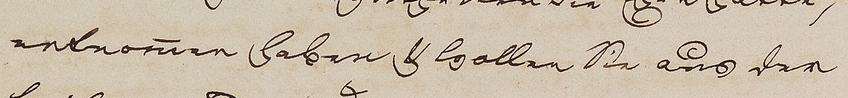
entnommen haben & wollen Sie aus der
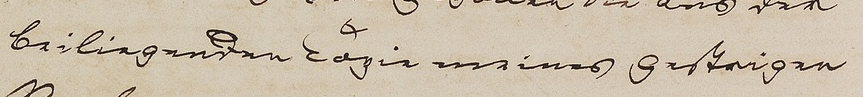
beiliegenden Copie meines gestrigen
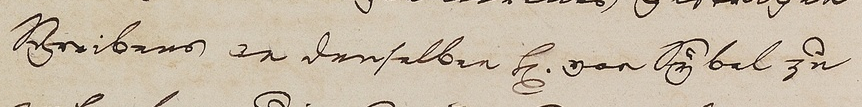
Schreibens an denselben H. von Sybel zu
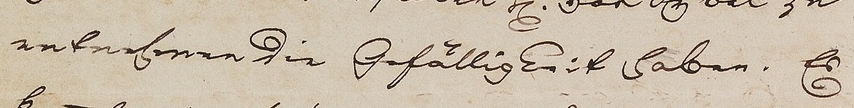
entnehmen die Gefälligkeit haben. Es
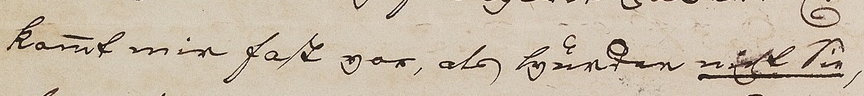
kommt mir fast vor, als würden nicht Sie,
